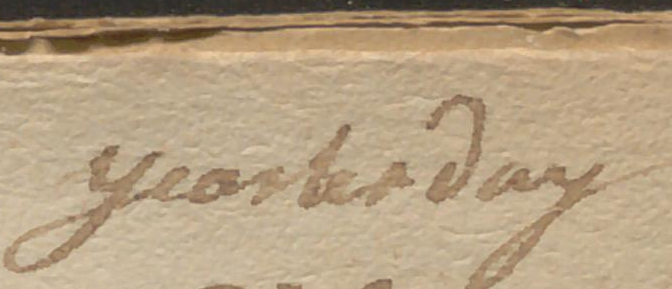yeasterday
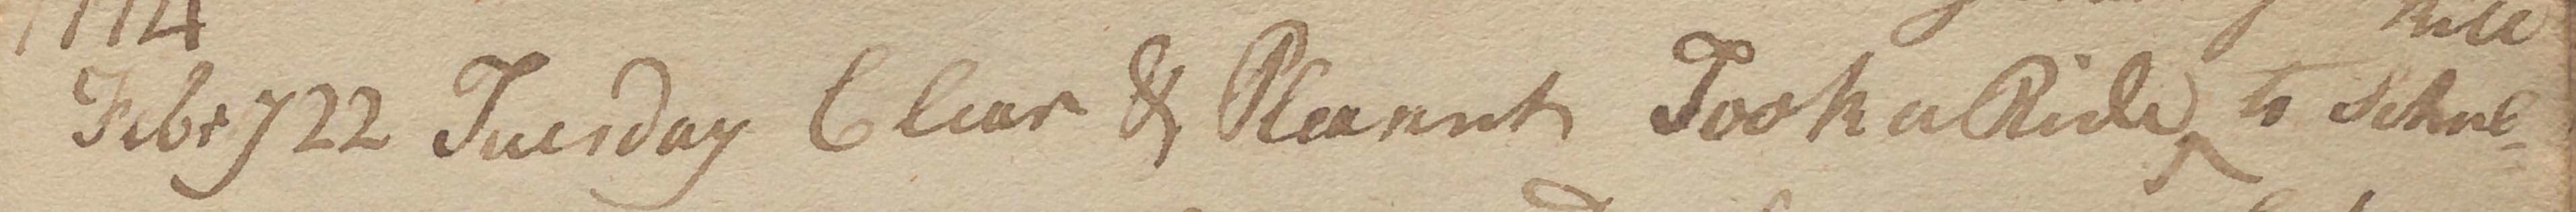Febr^y 22 Tuesday Clear & Pleasent Took a Ride ^ to schul-
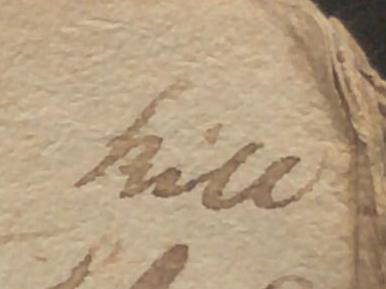kill
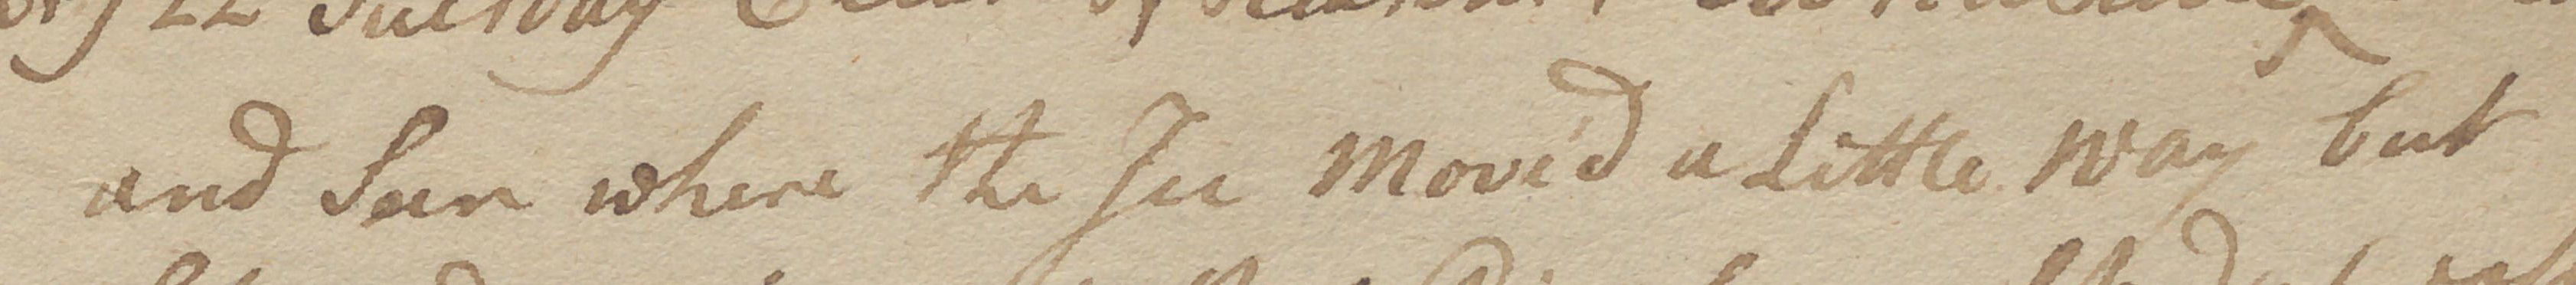and Seen where the Ice move'd a Little way but
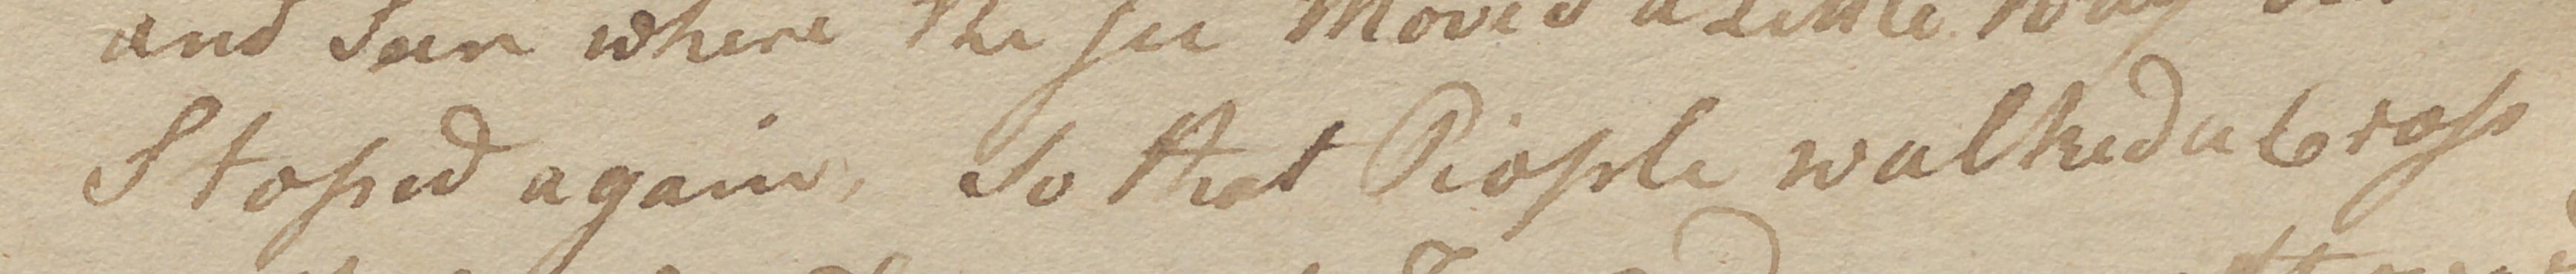Stoped again so that People walked a Cross
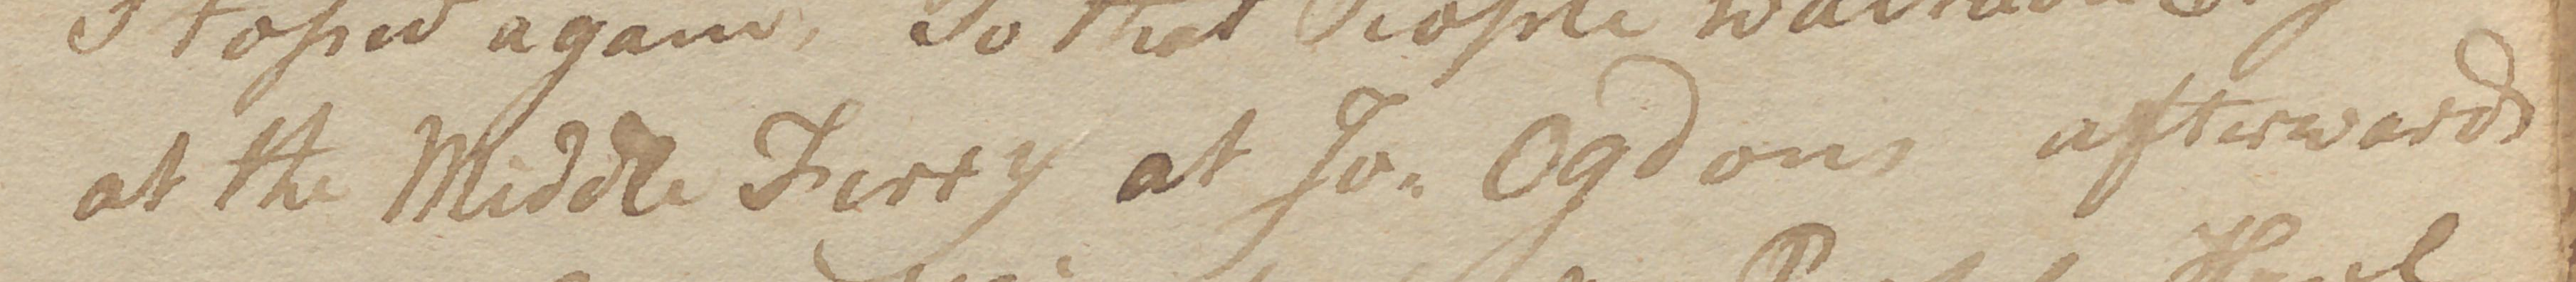at the Middle Ferry at Jo. Ogdons afterwards
